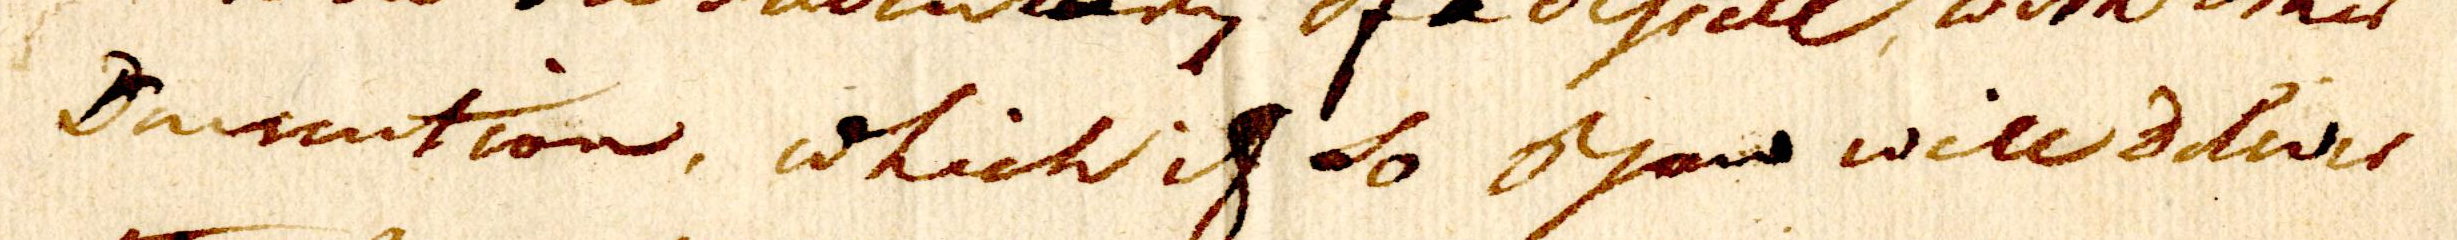Destination, which if so you will deliver
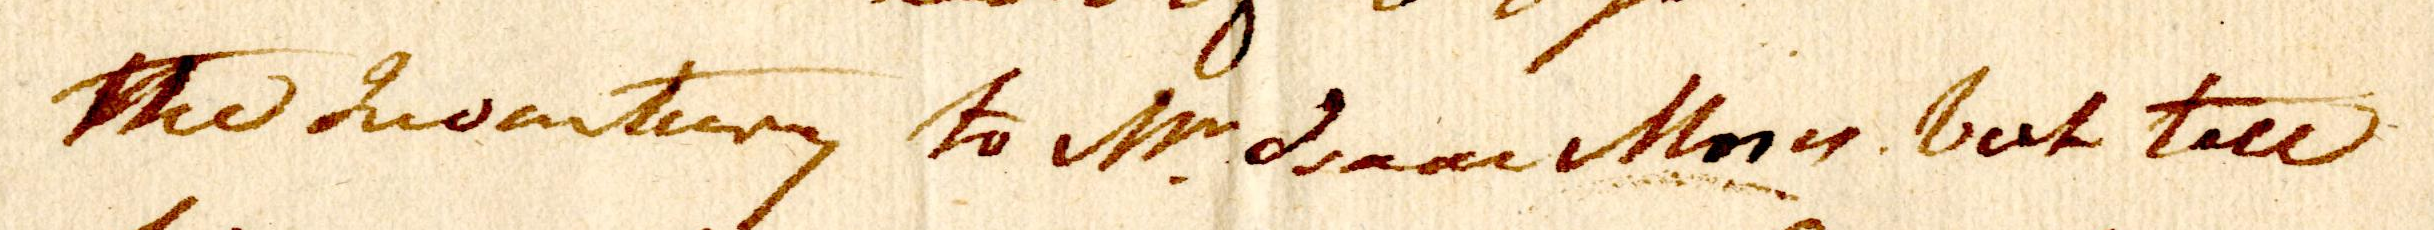the Inventory to M^r Isaac Moses but tell
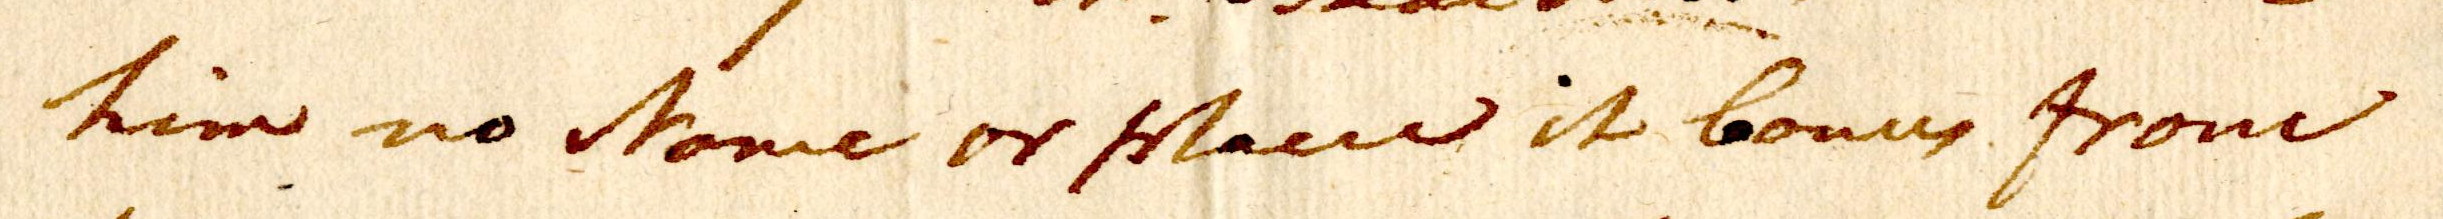him no name or place it Comes from
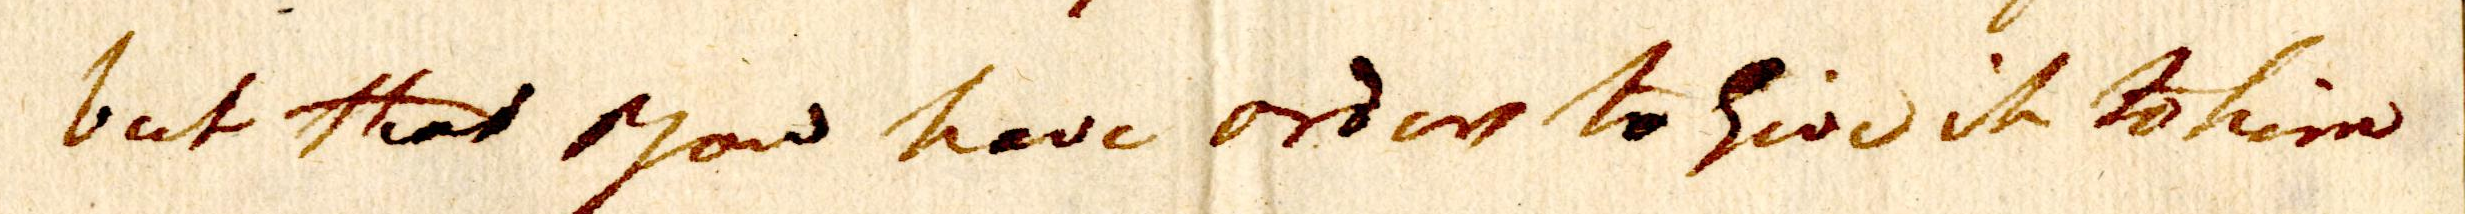but that you have orders to give it to him
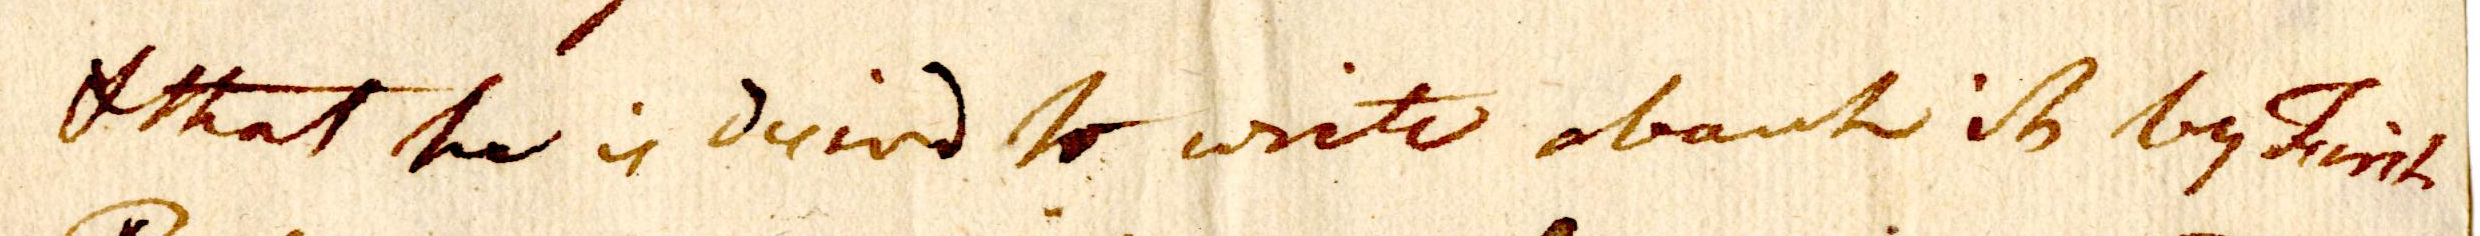& that he is desird to write about is by First
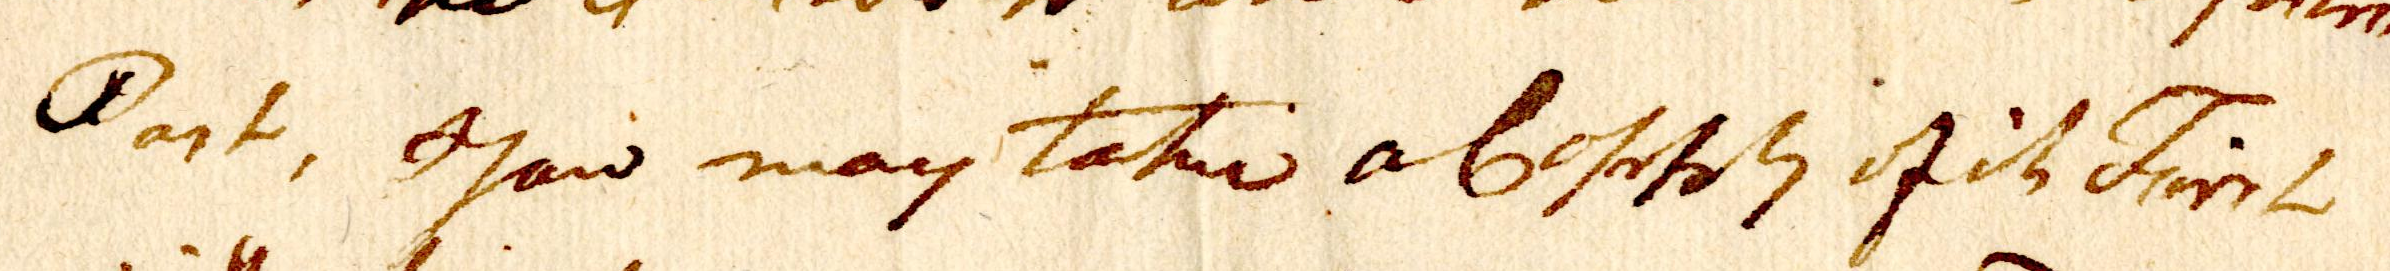Post, you may take a Coppy if it First
